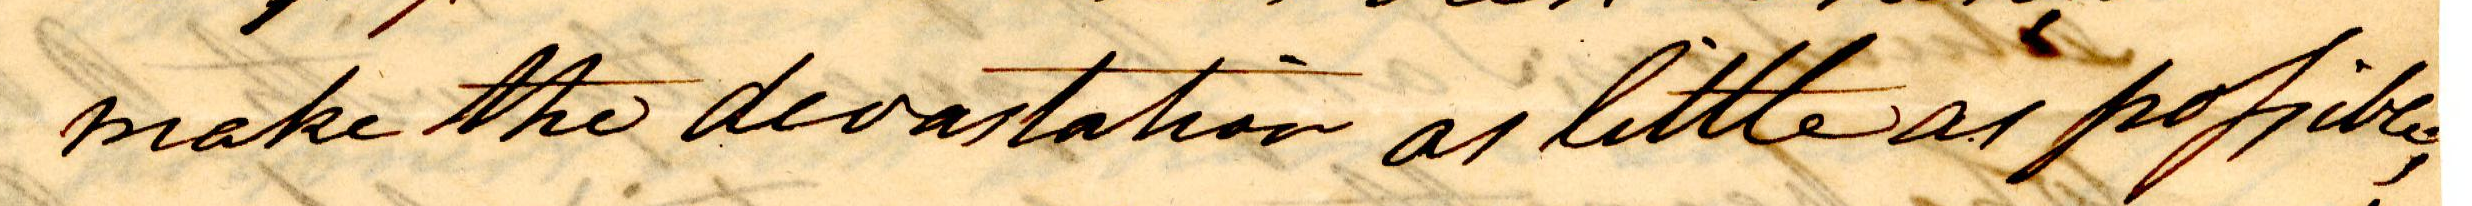make the devastation as little as possible,
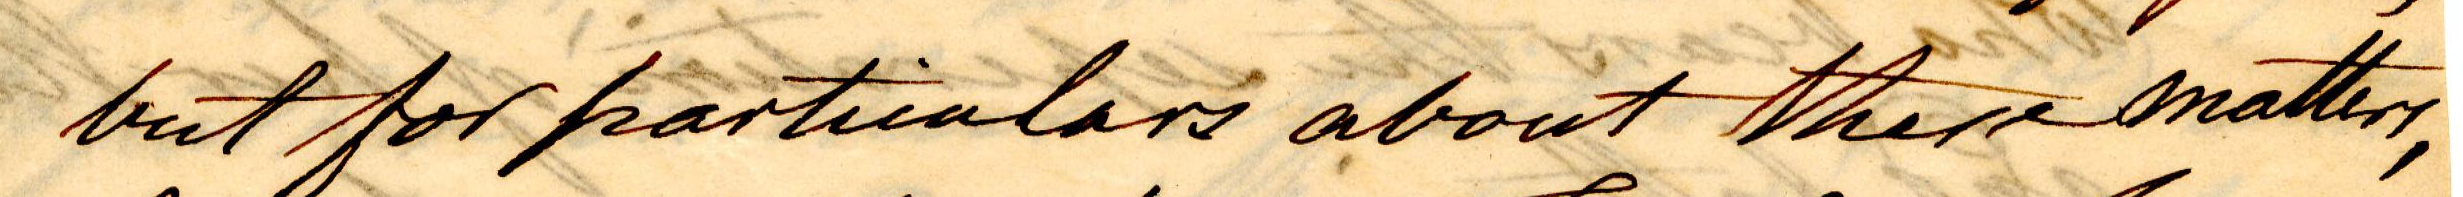but for particulars about these matters,
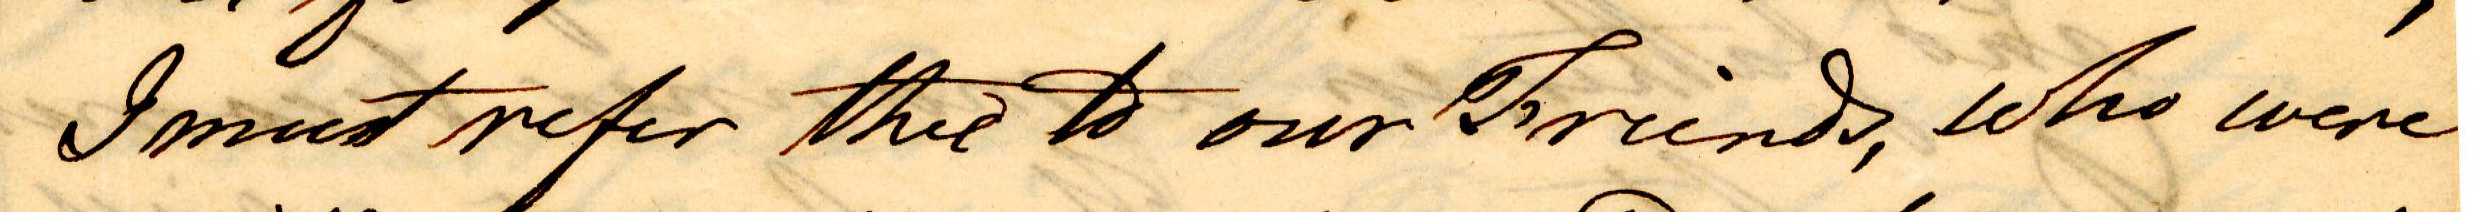I must refer thee to our Friends, who were
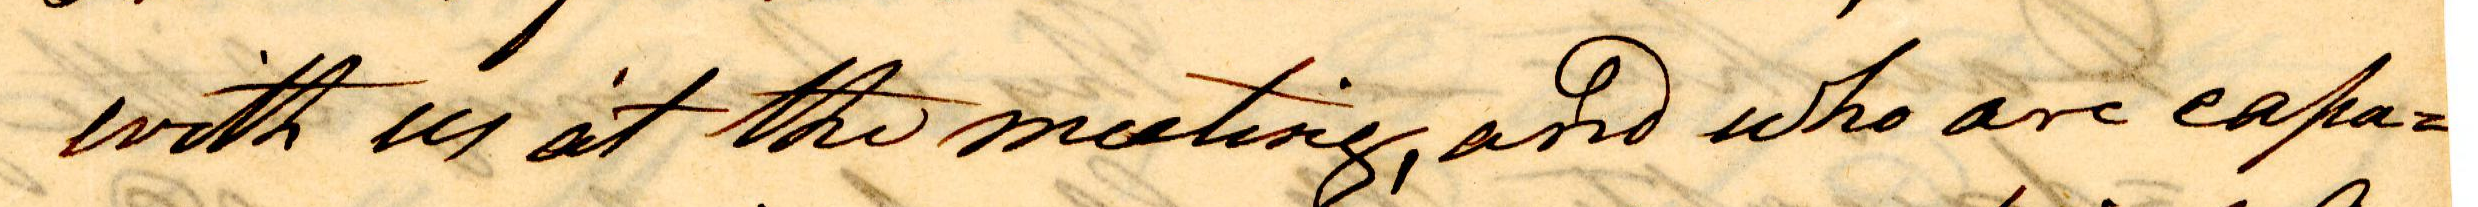with us at the meeting, and who are capa-
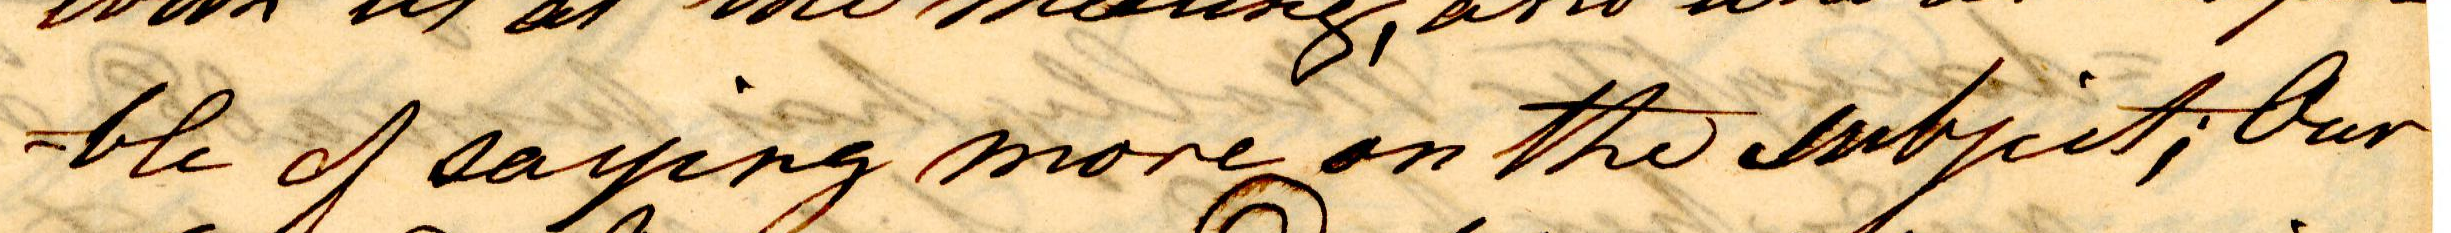-ble of saying more on the subject; Our
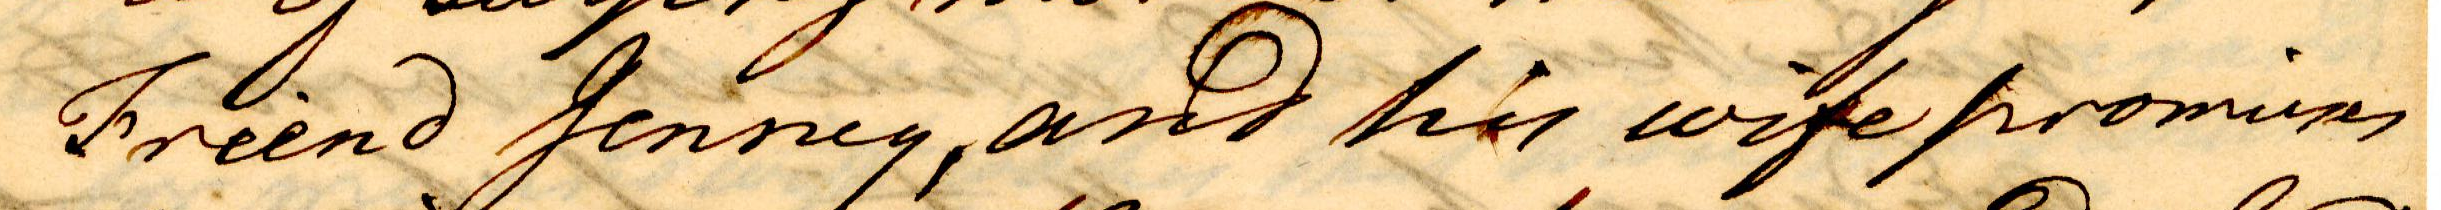Friend Jenney, and his wife promises
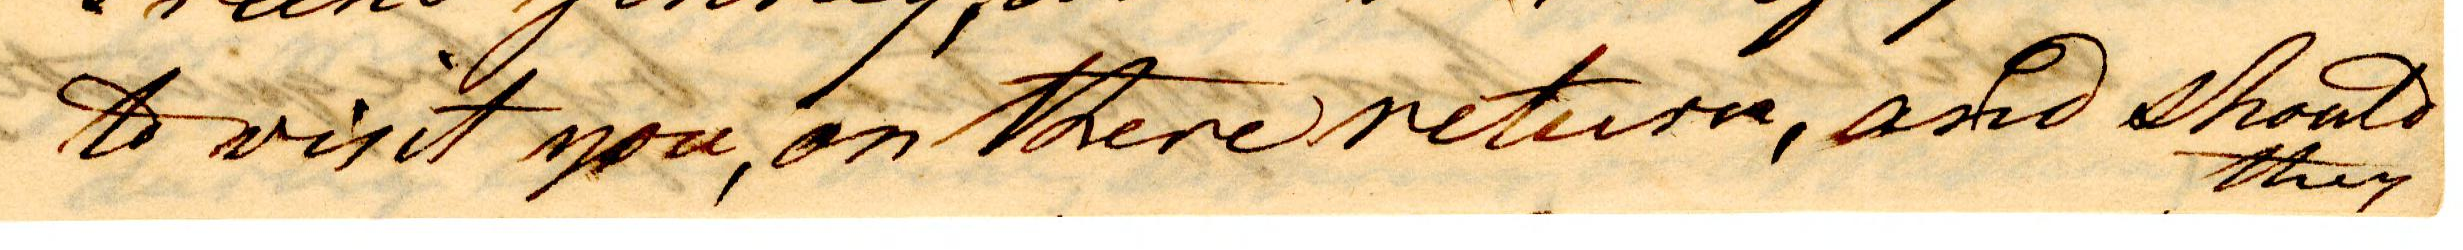to visit you, on there return, and should
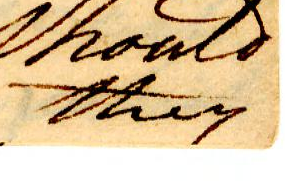they
